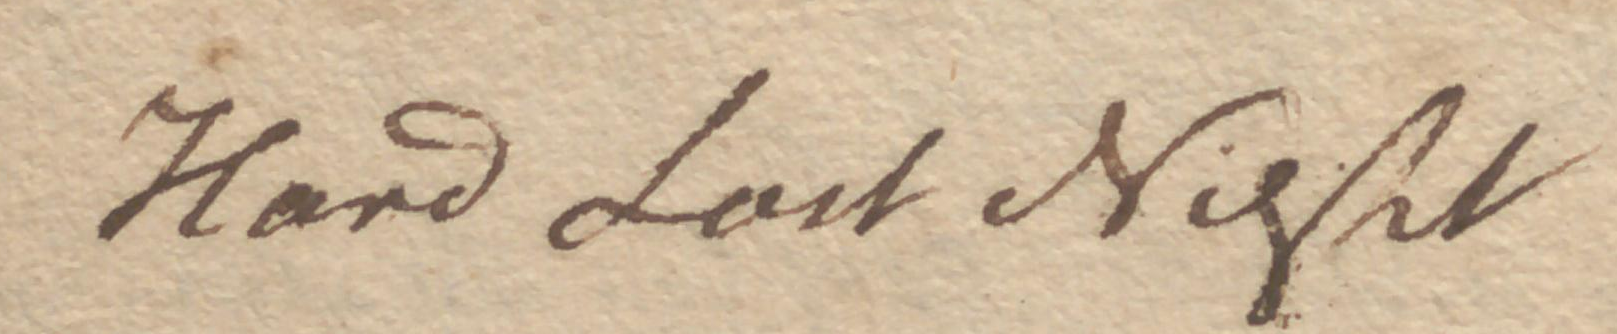Hard Last Night
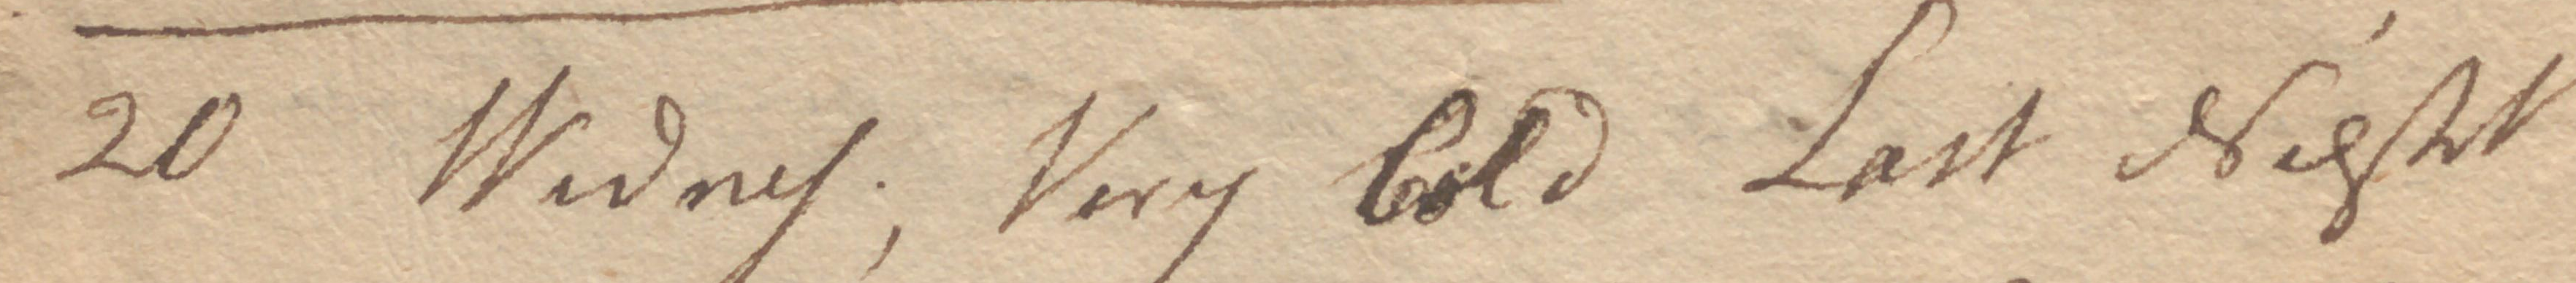20 Wednes. Very Cold Last Night
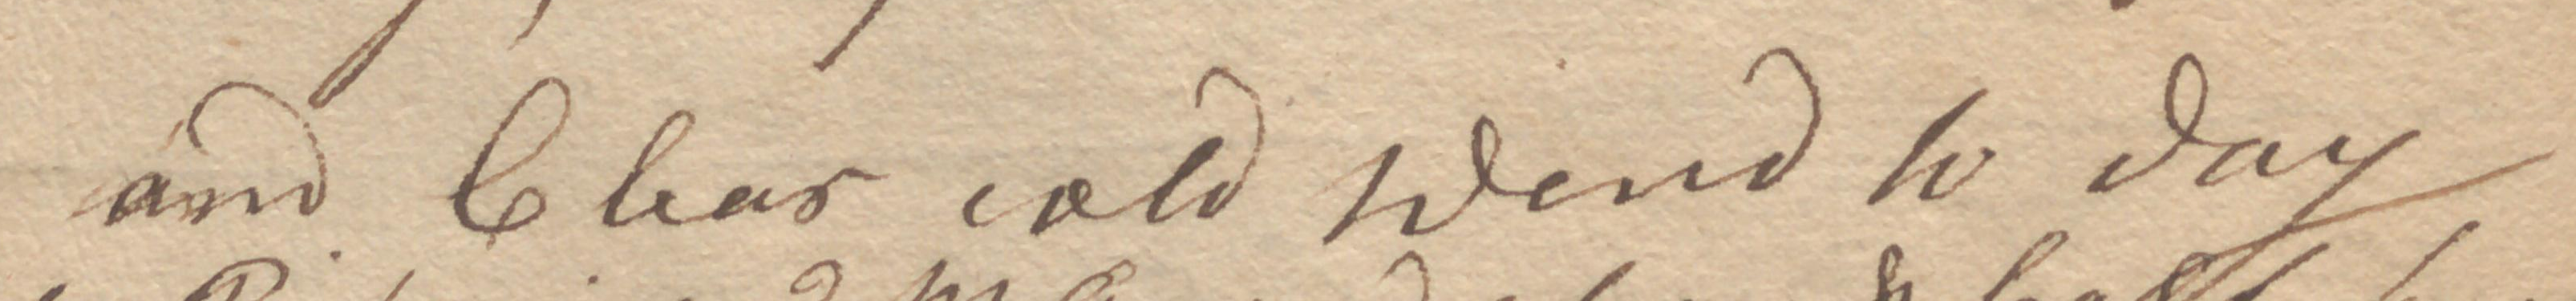am Clear cold wind to day
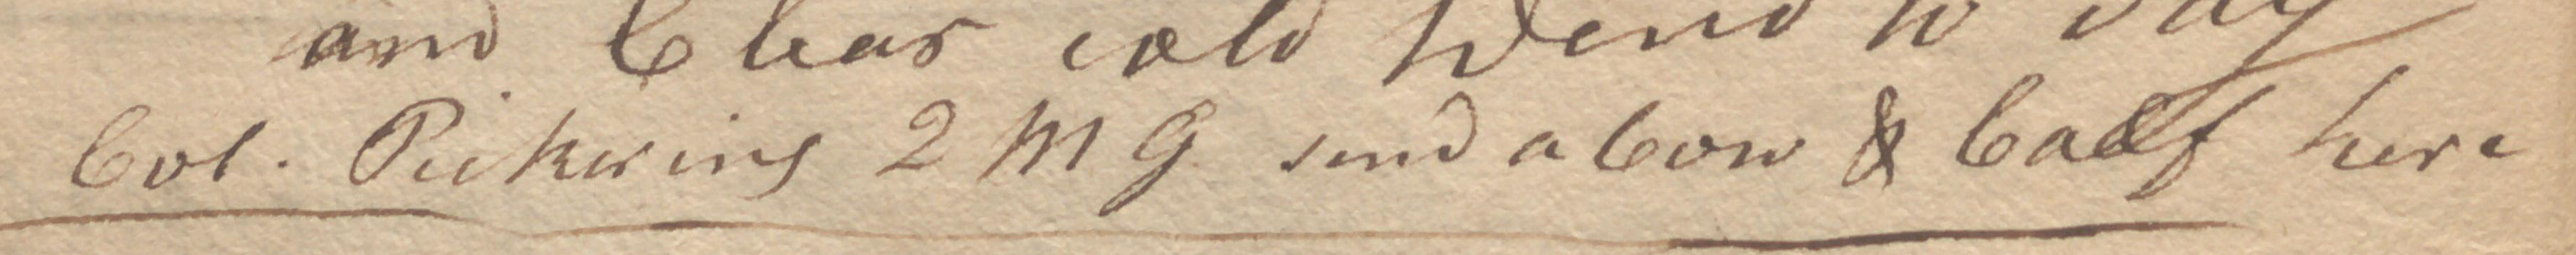Col. Pickering QMG send a Cow & Calf here
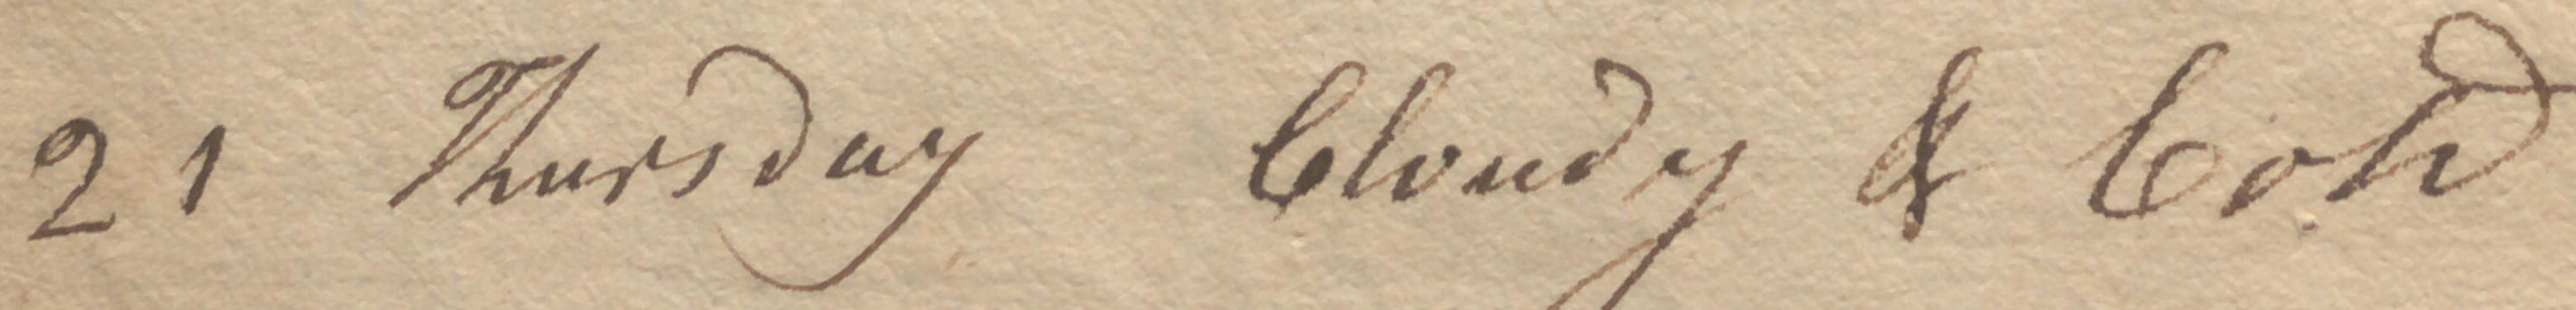21 Thursday Cloudy & Cold
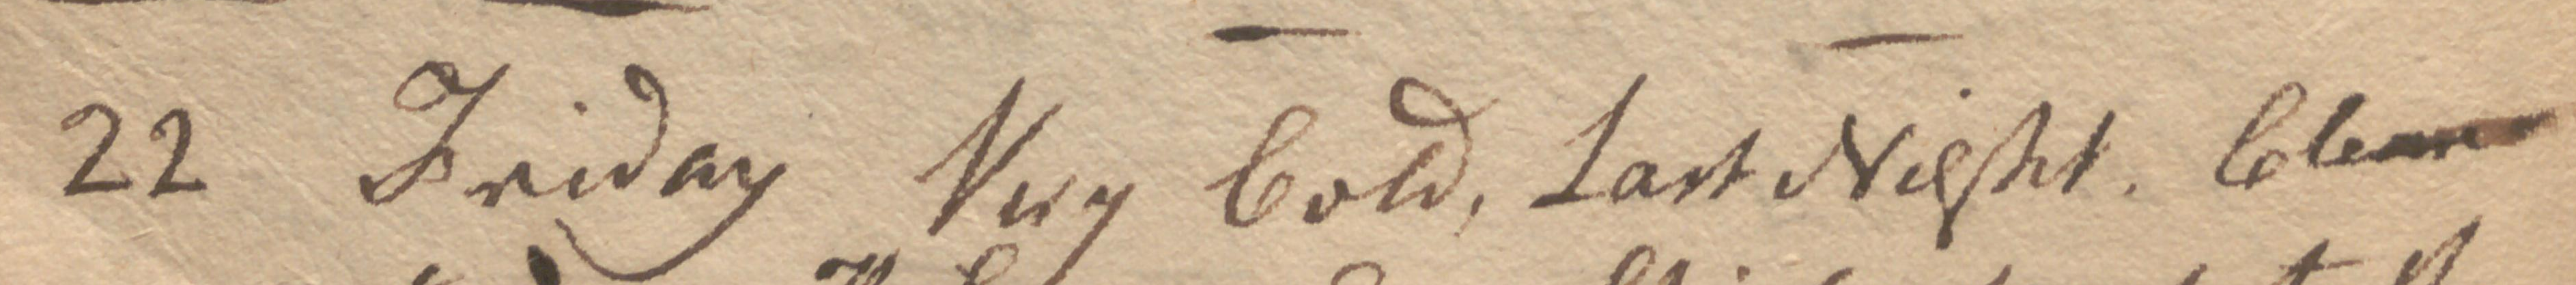22 Friday Very Cold, Last Night. Clear
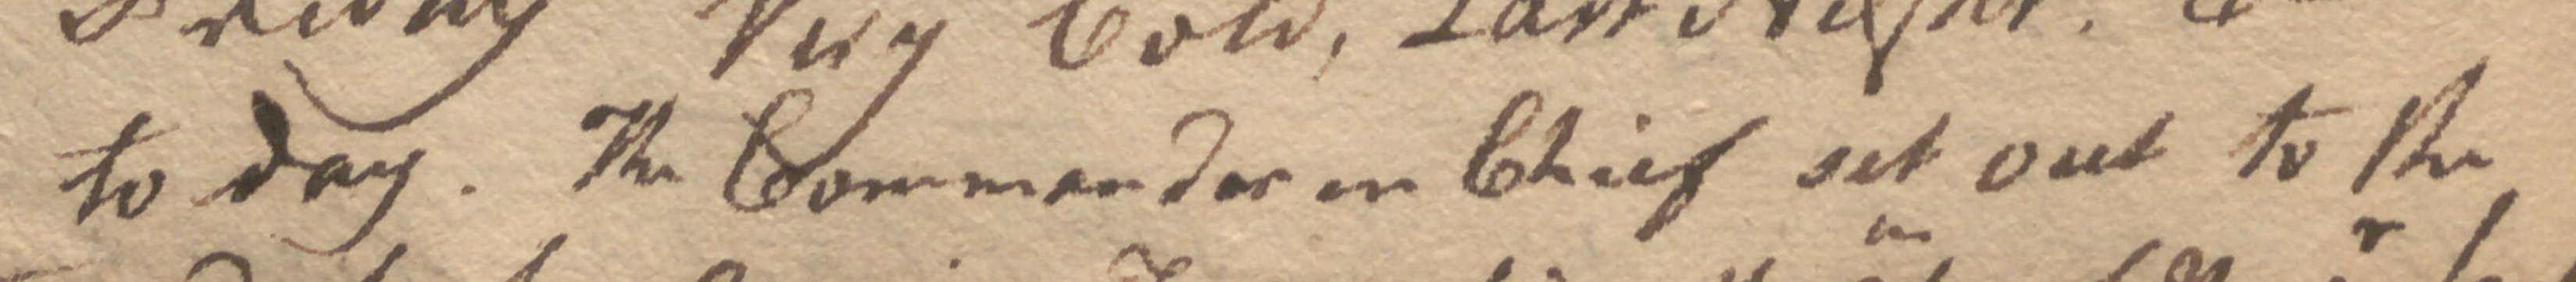to day. The Commander in Chief set out to the
